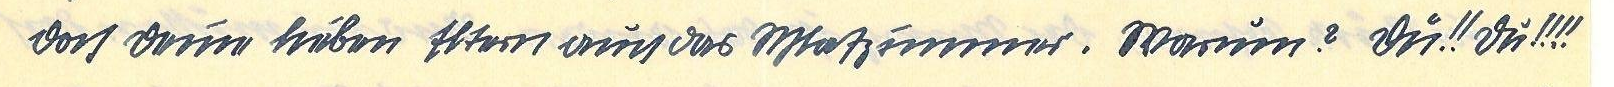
doch Deine lieben Eltern auch das Schlafzimmer. Warum? Du!! Du!!!!
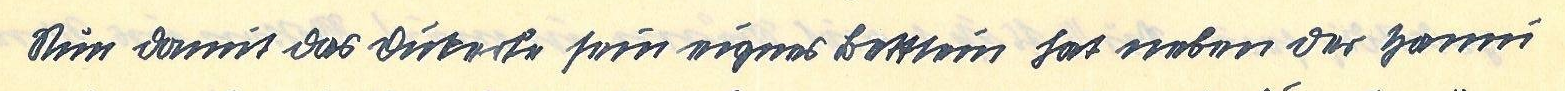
Nur damit das Dickerle sein eignes Bettlein hat neben der
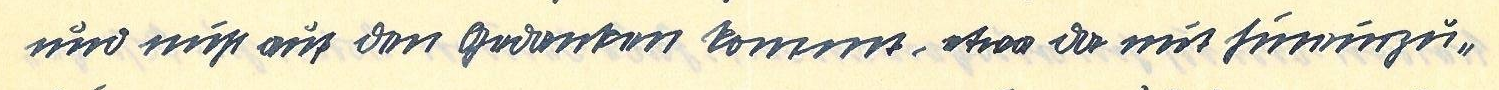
und nicht auf den Gedanken kommt, etwa da mit hineinzu¬
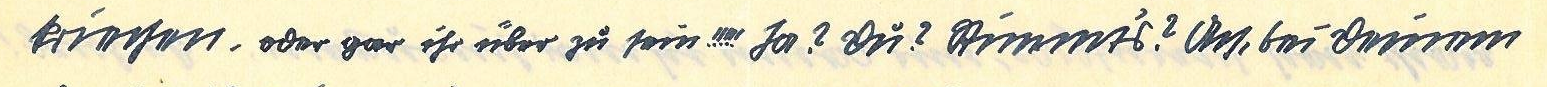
kriechen, oder gar ihr über zu sein!!!!! Ja? Du? Stimmt’s? Ach, bei Deinem
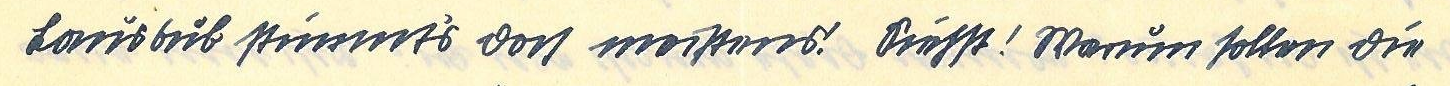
Lausbub stimmt’s doch meistens! Siehst! Warum sollen die
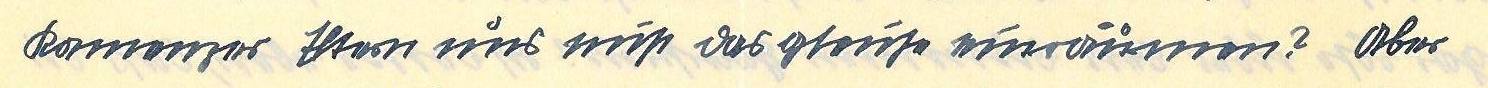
K.er Eltern uns nicht das gleiche einräumen? Aber
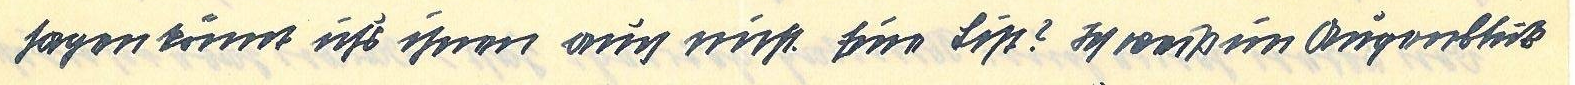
sagen könnt ich’s ihnen auch nicht. Eine List? Ich weiß im Augenblick
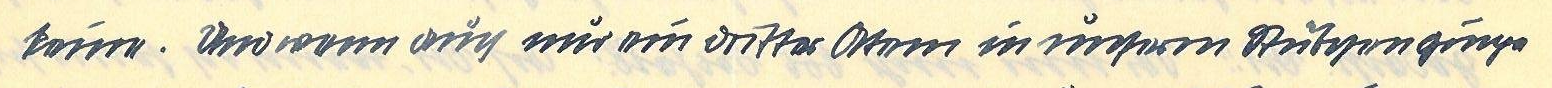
keine. Und wenn auch nur ein dritter Atem in unserm Stübchen ginge
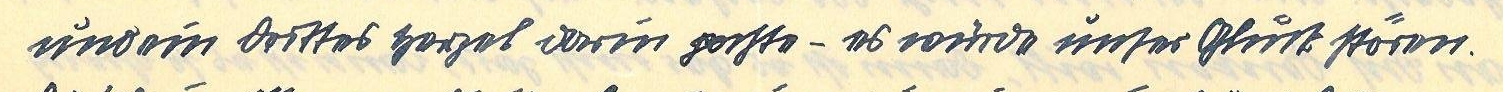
und ein drittes Herzel darin pochte – es würde unser Glück stören.
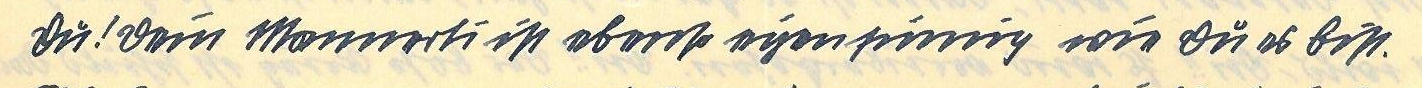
Du! Dein Mannerli ist ebenso eigensinnig wie Du es bist.
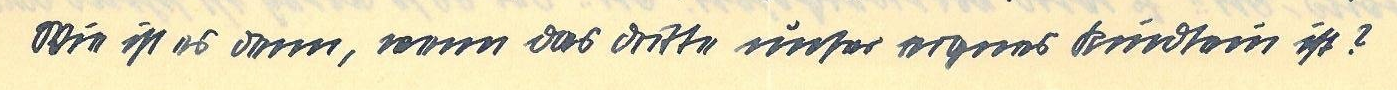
Wie ist es denn, wenn das dritte unser eigenes Kindlein ist?
